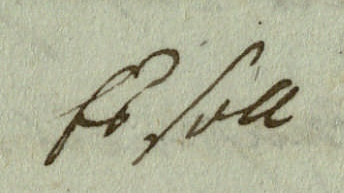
Es soll
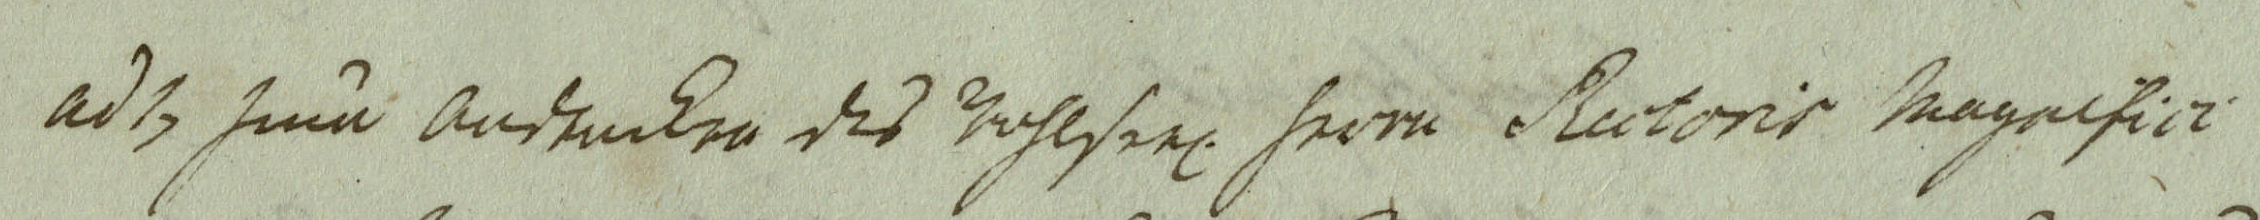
ad 1, zum Andencken des Wohlseel. herrn Rectoris Magnifici
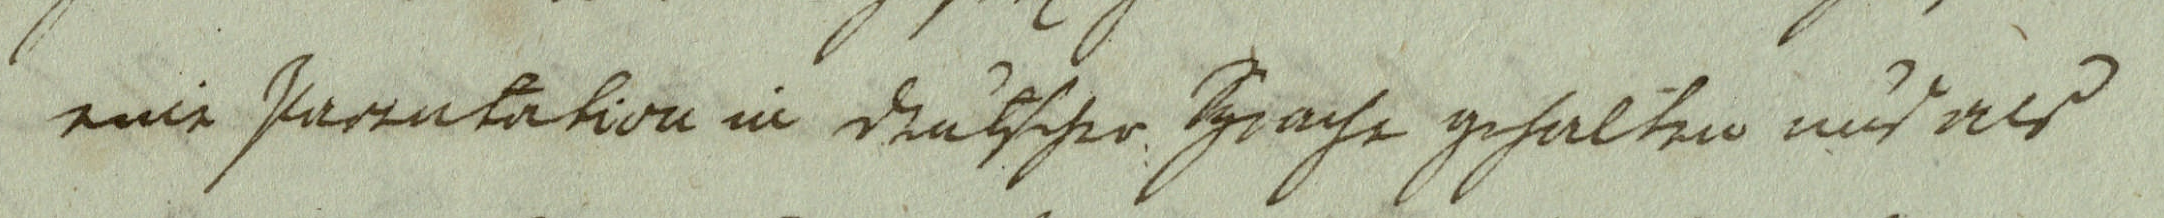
eine Parentation in der deutschen Sprache gehalten und als
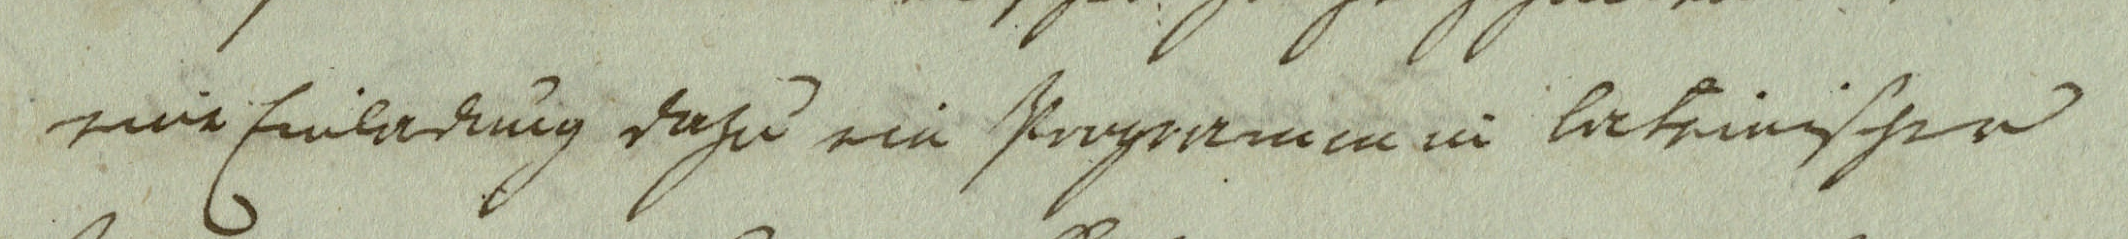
eine Einladung dazu ein Programm in lateinischer
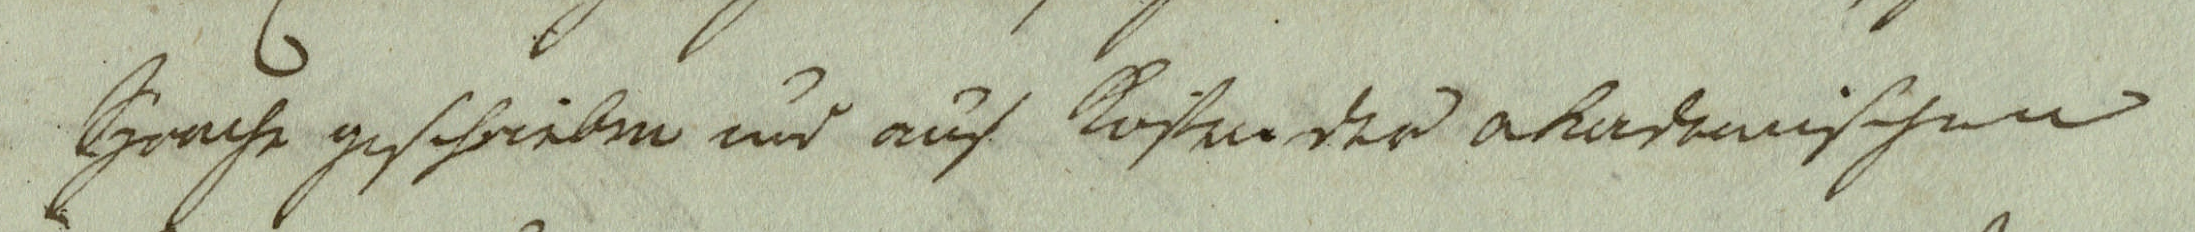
Sprache geschrieben und auf Kosten der akademischen
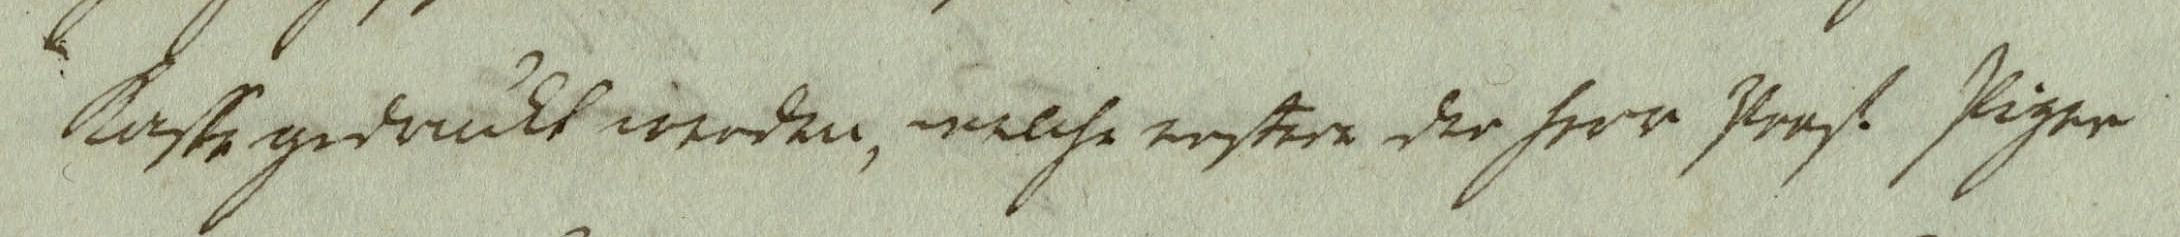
Kasse gedruckt werden, welche erstere der herr Prof. Piper
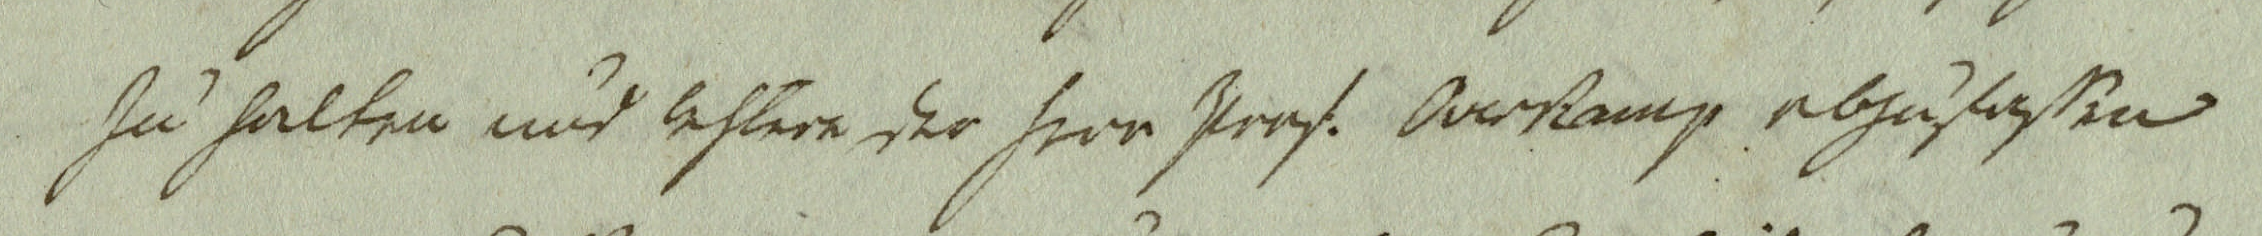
zu halten und letztere der herr Prof. Overkamp abzulassen
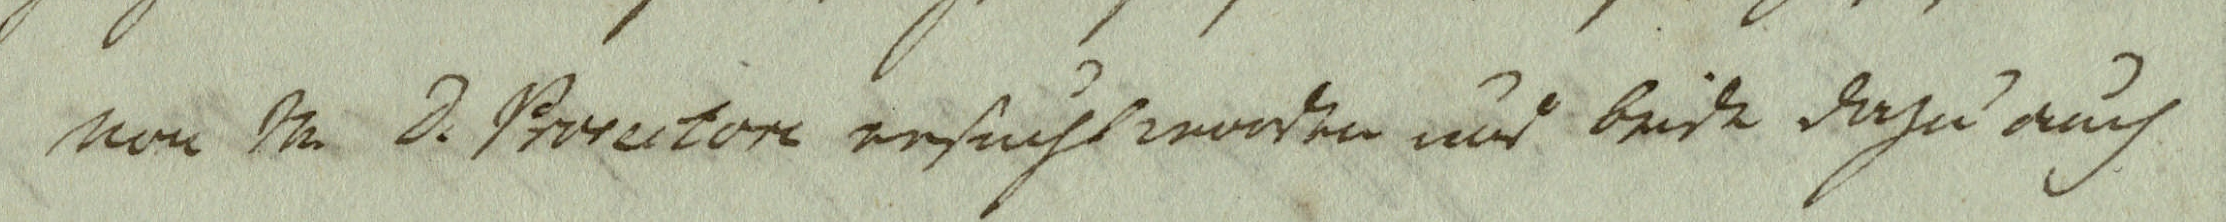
von M. D. Prorectore ersucht worden und beide dazu auch
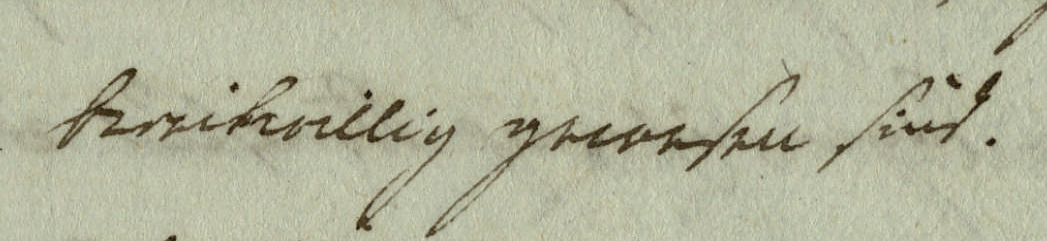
bereitwillig gewesen sind.
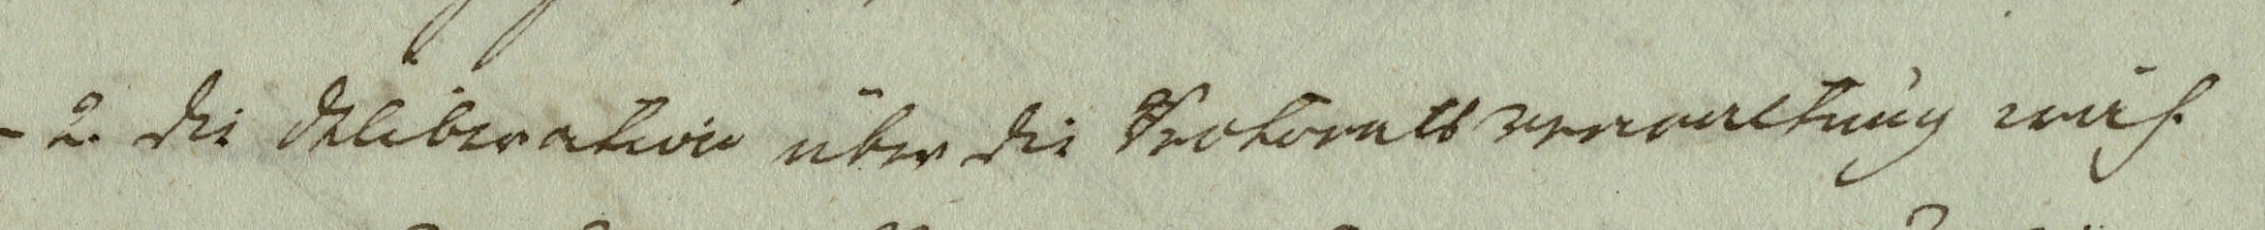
2. Die Deliberation über die Rectoratsverwaltung wäh¬
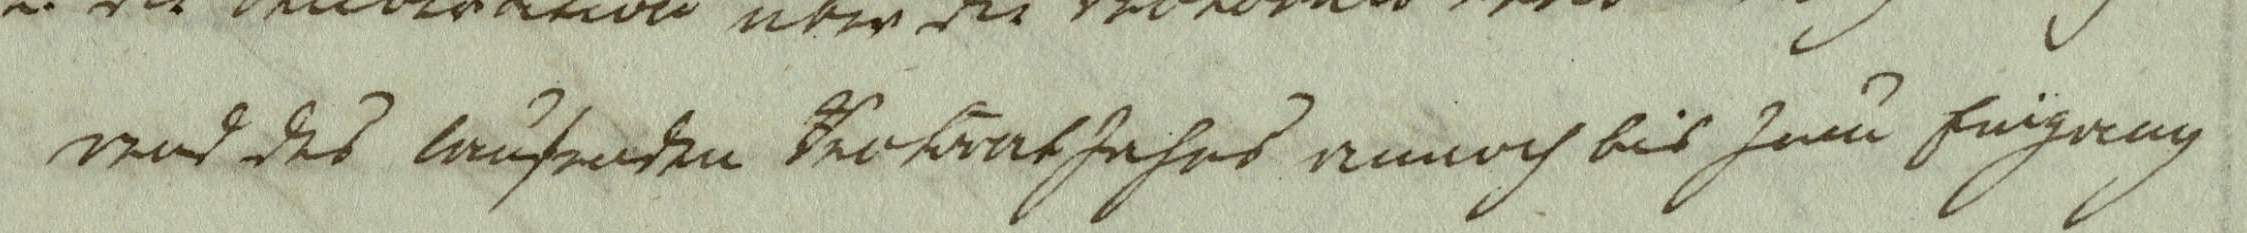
rend des laufenden Rectoratjahres annoch bis zum Eingang
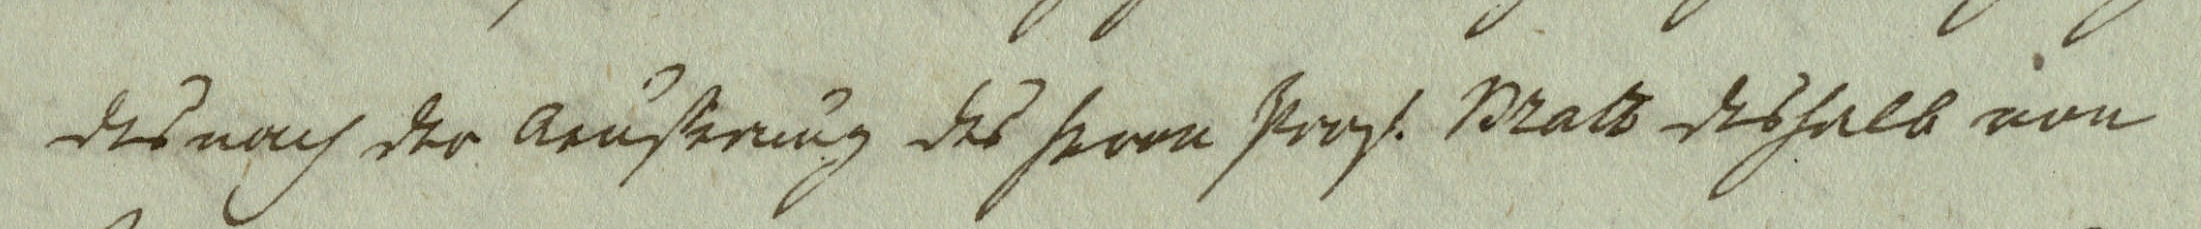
des nach der Äusserung des herrn Prof. Bratt deshalb von
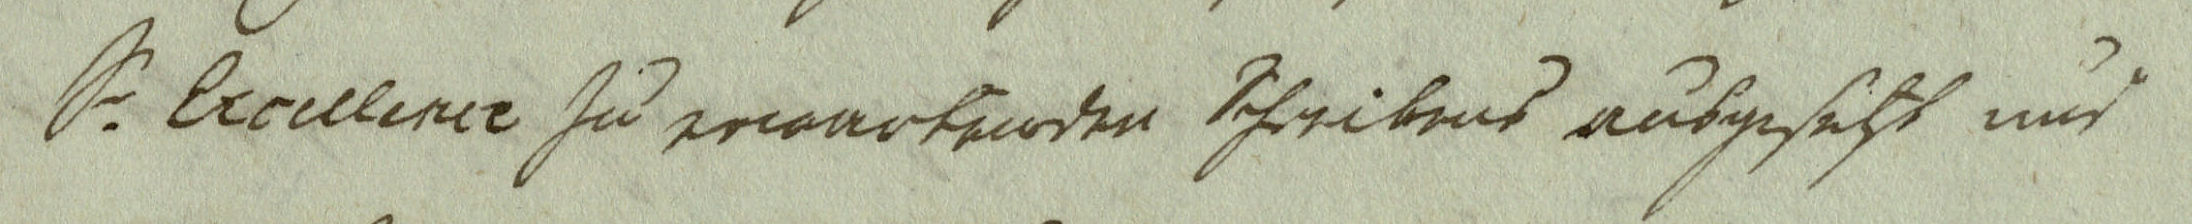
Sr. Excellence zu erwartenden Schreibens ausgesetzt und
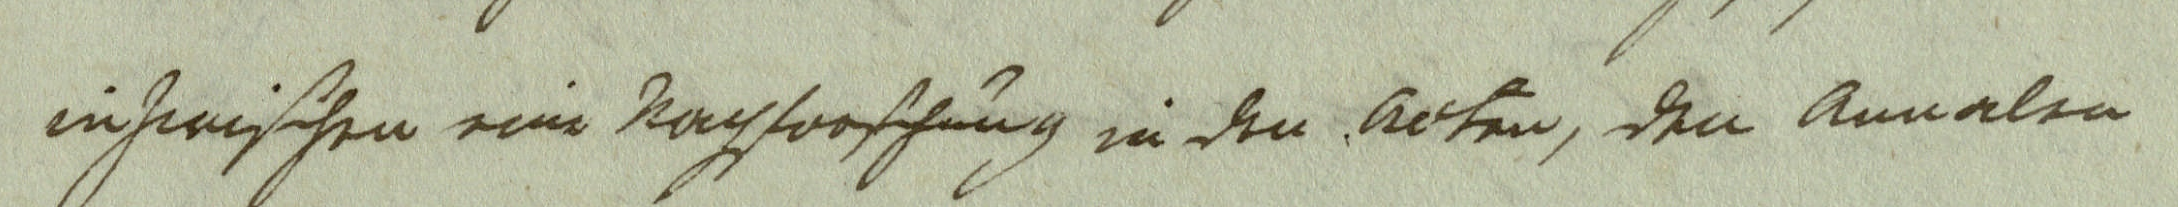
inzwischen eine Nachforschung in den Acten, den Annalen
